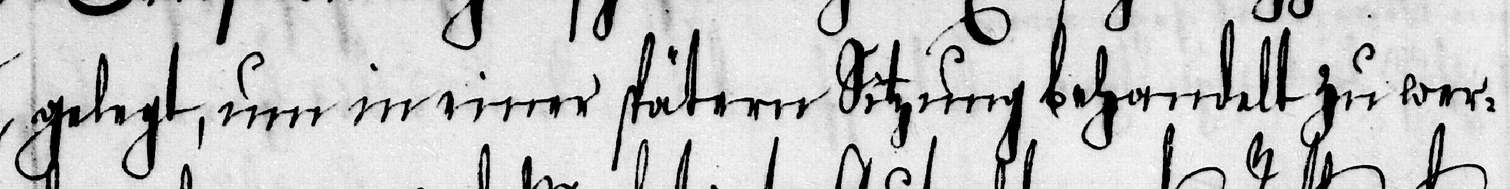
gelegt, um in einer spätern Sitzung behandelt zu wer¬
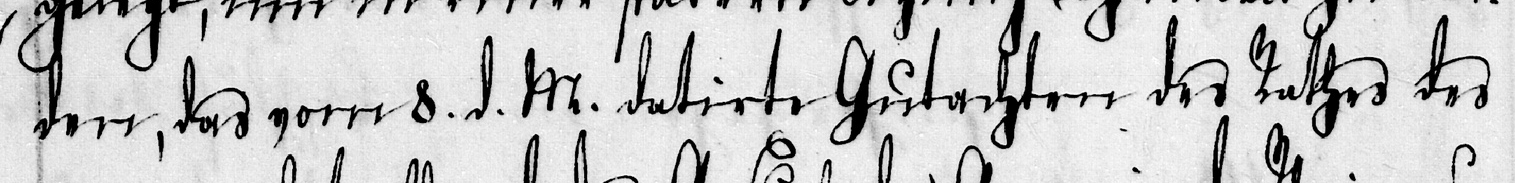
den, das vom 8. d. M. datirte Gutachten des Rathes des
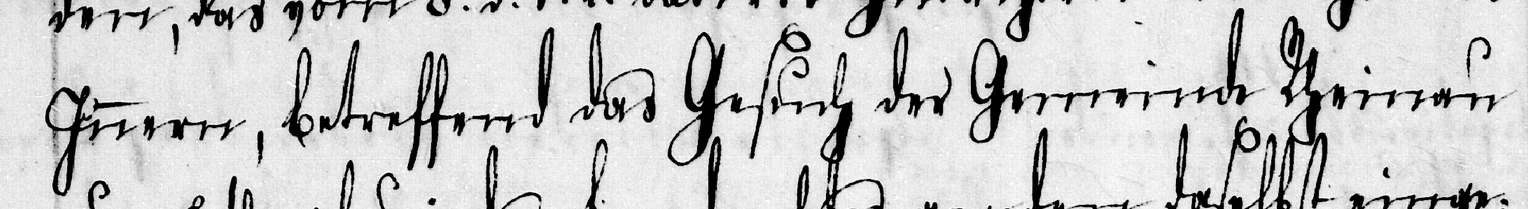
Innern, betreffend das Gesuch der Gemeinde Rheinau
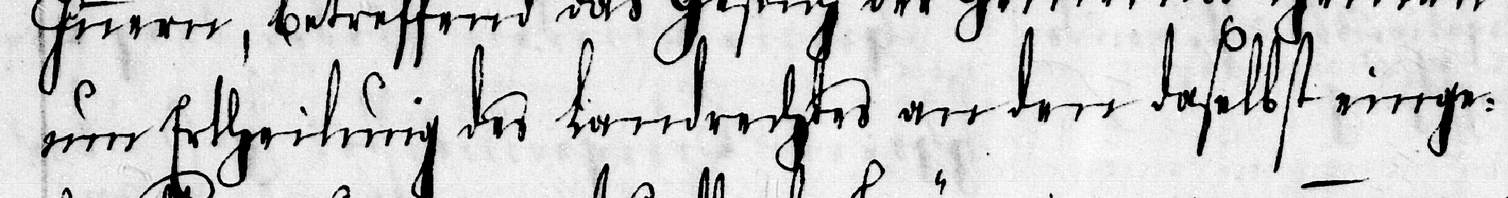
um Ertheilung des Landrechtes an den daselbst einge¬
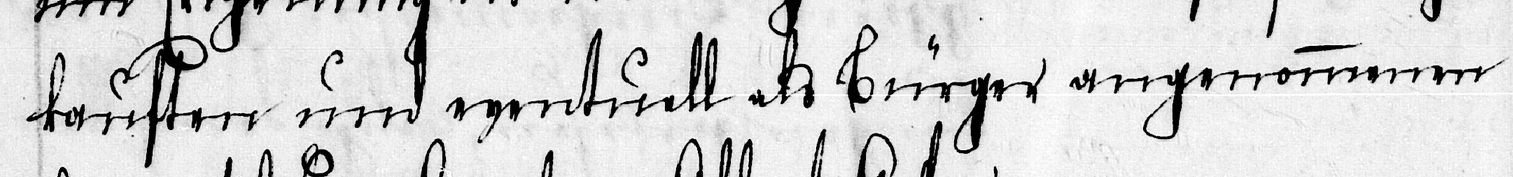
kauften und eventuell als Bürger angenommenen
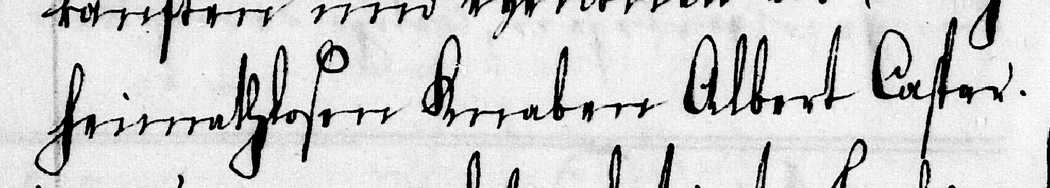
heimathlosen Knaben Albert Caspar.
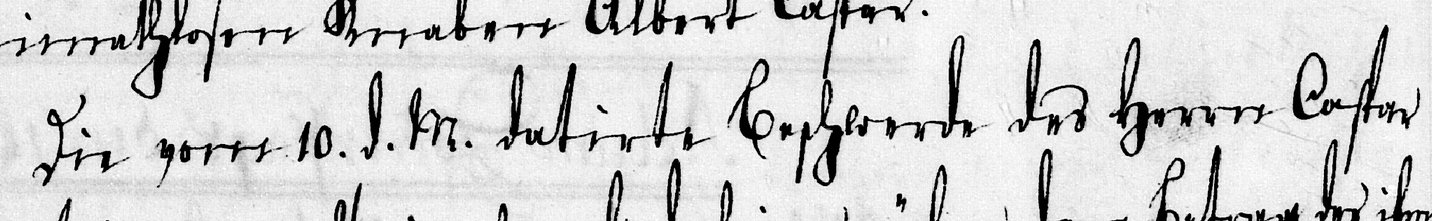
Die vom 10. d. M. datirte Beschwerde des Herrn Caspar
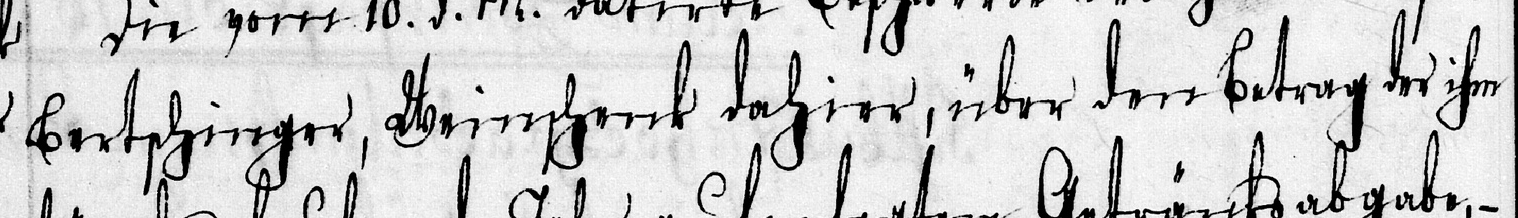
Bertschinger, Weinschenk dahier, über den Betrag der ihm
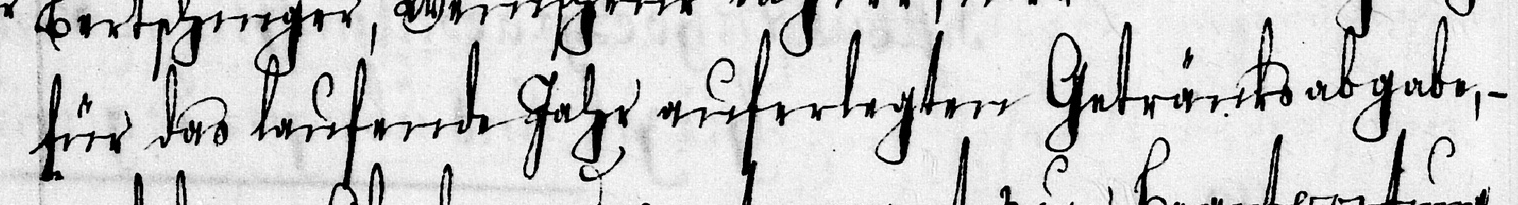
für das laufende Jahr auferlegten Getränksabgabe,
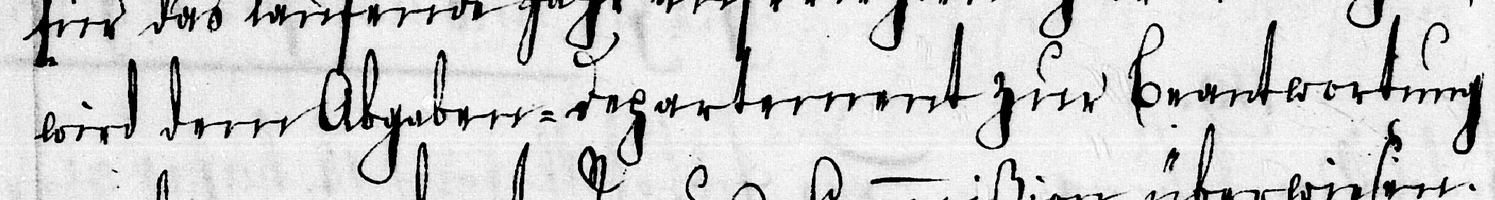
wird dem Abgaben-Departement zur Beantwortung
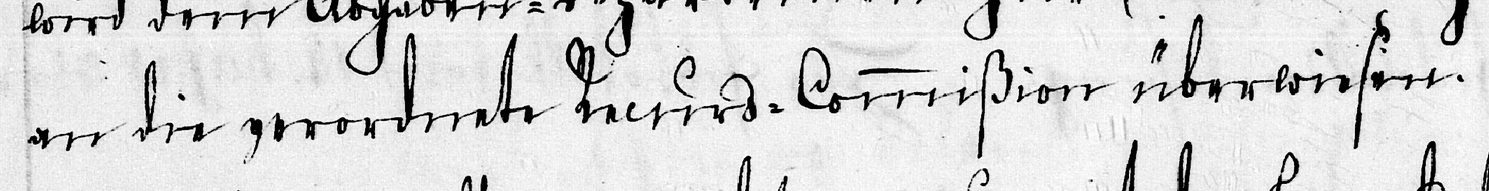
an die verordnete Recurs-Commißion überwiesen.
